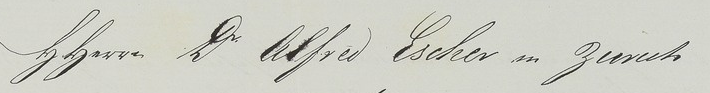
HHerrn Dr Alfred Escher in Zürich
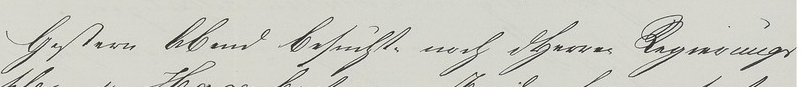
Gestern Abend besuchte noch d Herren Regierungs-
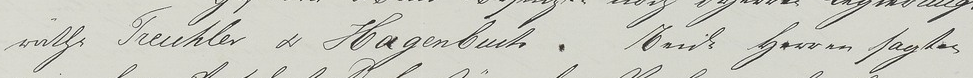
räthe Treichler & Hagenbuch. Beide Herren sagten
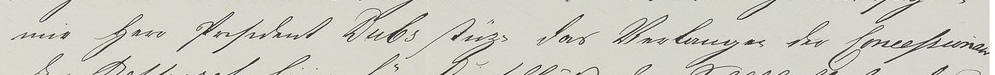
mir Herr President Dubs stüze das Verlangen der Concessionaire
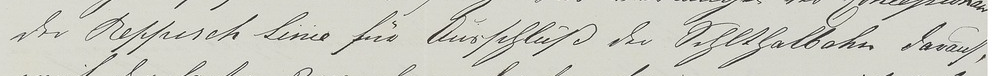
der Reppisch Linie für Ausschluß der Sihlthalbahn darauf,
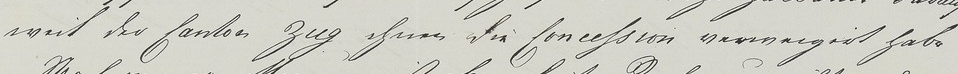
weil der Canton Zug ihnen die Concession verweigert habe.
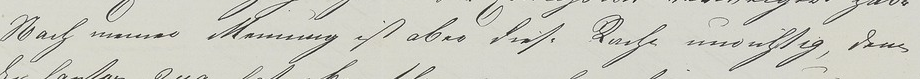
Nach meiner Meinung ist aber diese Rache unrichtig, denn
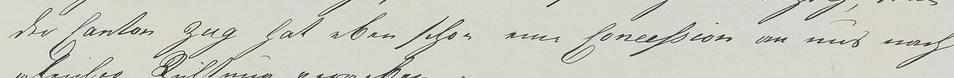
der Canton Zug hat eben schon eine Concession an uns nach
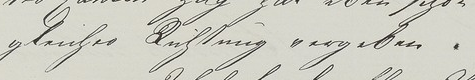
gleicher Richtung vergeben.
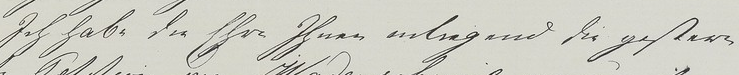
Ich habe die Ehre Ihnen anliegend die gestern
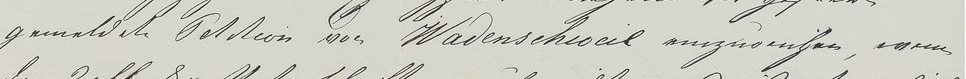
gemeldete Petition von Wädenschweil einzureichen, wenn
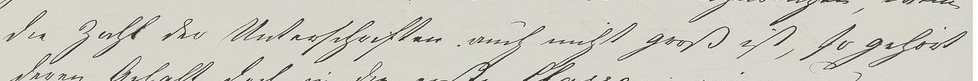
die Zahl der Unterschriften auch nicht groß ist, so gehört
